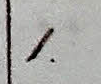1.
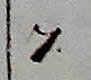7.
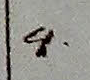4
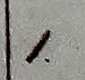1.
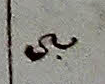5.
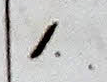1.
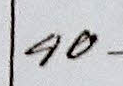40
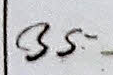35
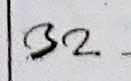32
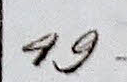49
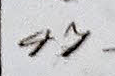47
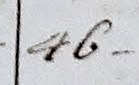46
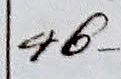46
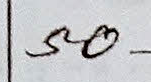50
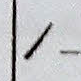1
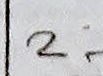2
